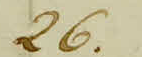26.
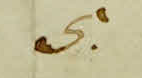5.
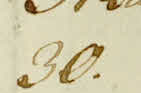30.
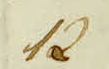12
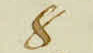8
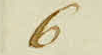6
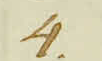4.
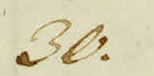30.
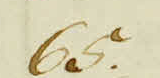65.
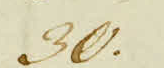30.
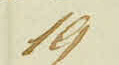19
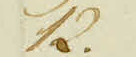12.
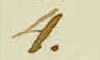4.
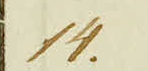14.
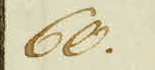60.
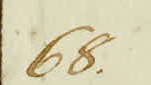68.
